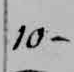10
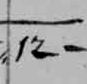12
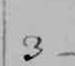3
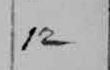12
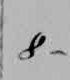8
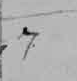7
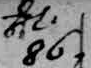86
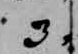3
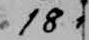18
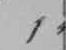1
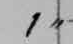1
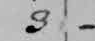3
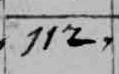112
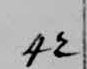42
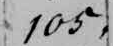105
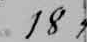18
